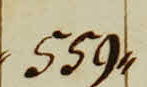559
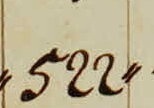522
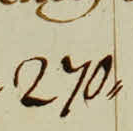270
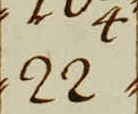22
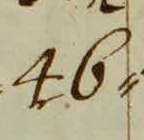46
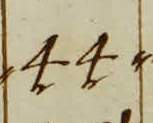44
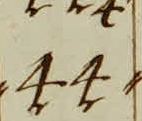44
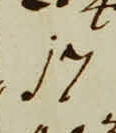17
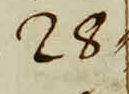28
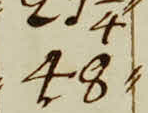48
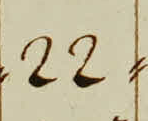22
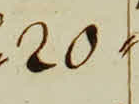20
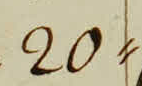20
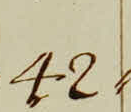42
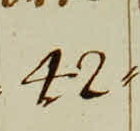42
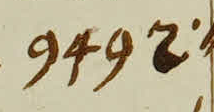9492.
